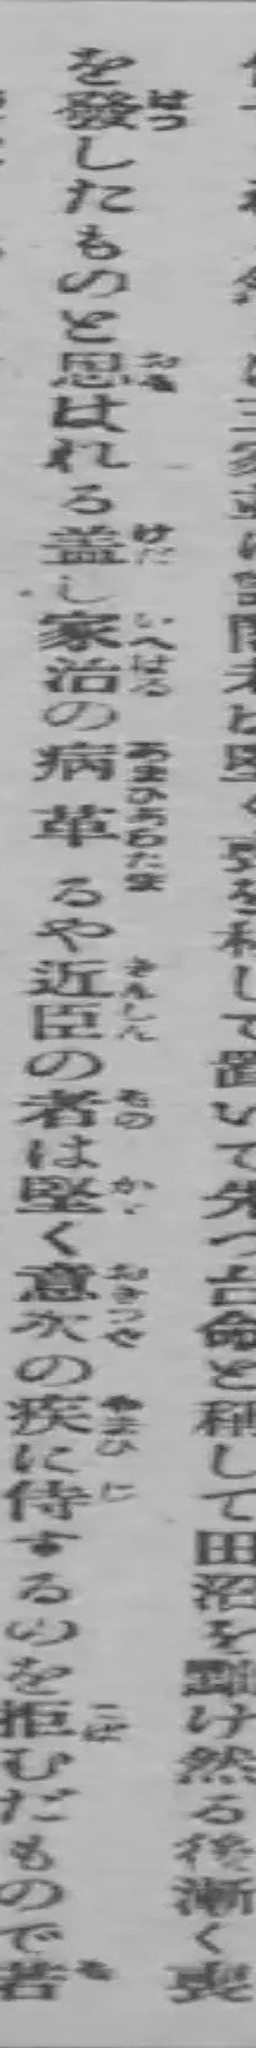を発したものと思はれる蓋し家治の病革るや近臣の者は堅く意次の疾に侍するのを拒むだもので若
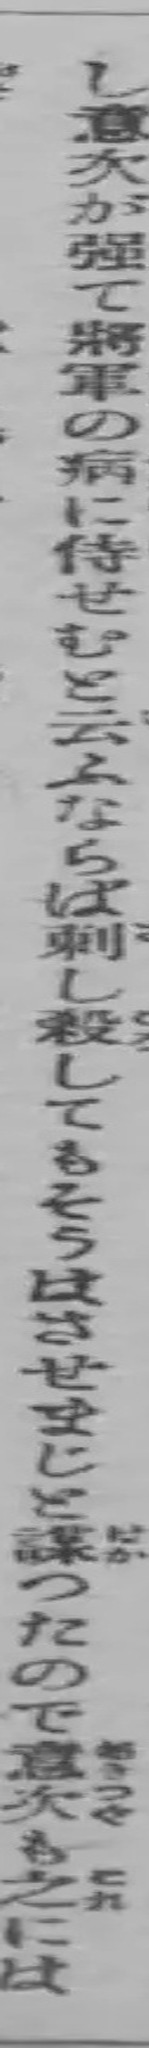し意次が強て将軍の病に侍せむと云ふならば刺し殺してもそうはさせまじと謀つたので意次も之には
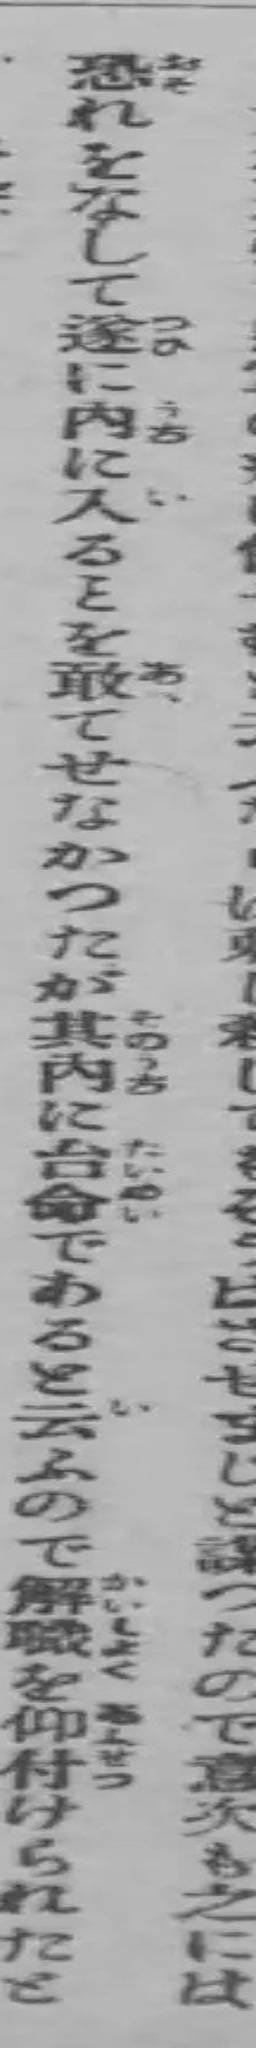恐れをなして遂に内に入ることを敢てせなかつたが其内に台命であると云ふので解職を仰付けられたと
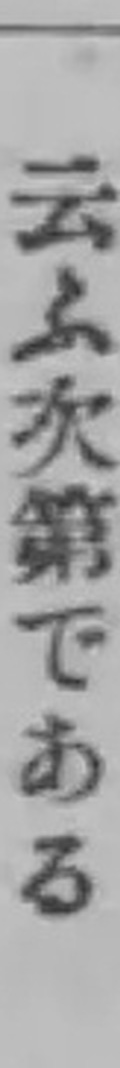云ふ次第である
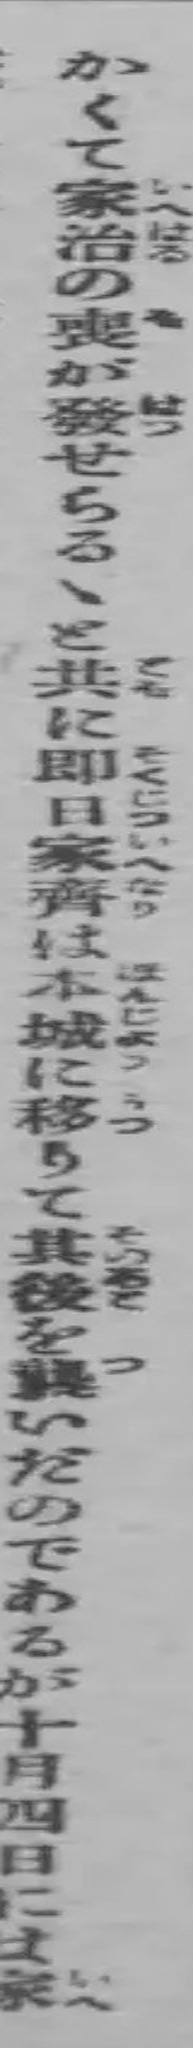かくて家治の喪が発せらるゝと共に即日家斉は本城に移りて其後を襲いだのであるが十月四日には家
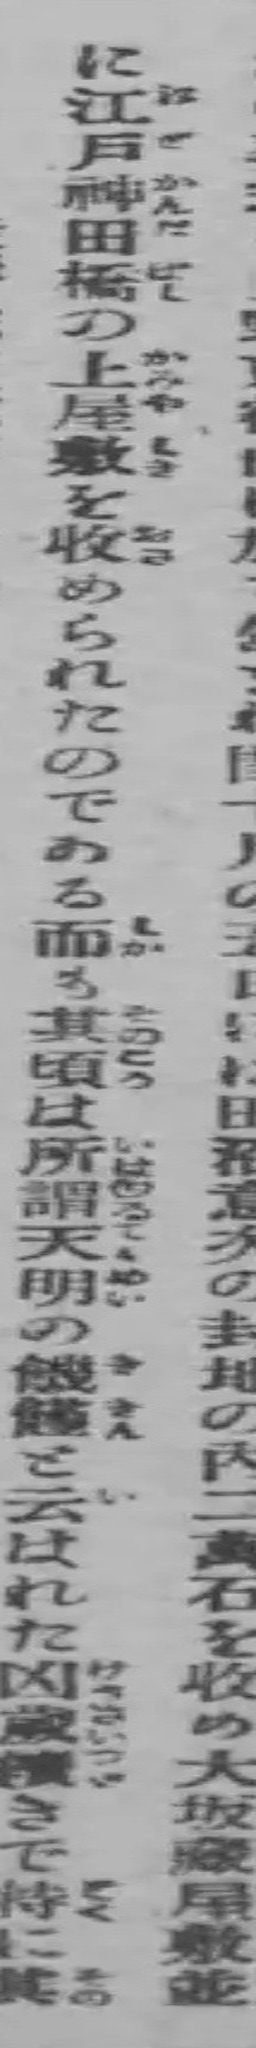天明の饑饉に江戸神田橋の上屋敷を収められたのである而も其頃は所謂天明の饑饉と云はれた凶歳続きで特に其
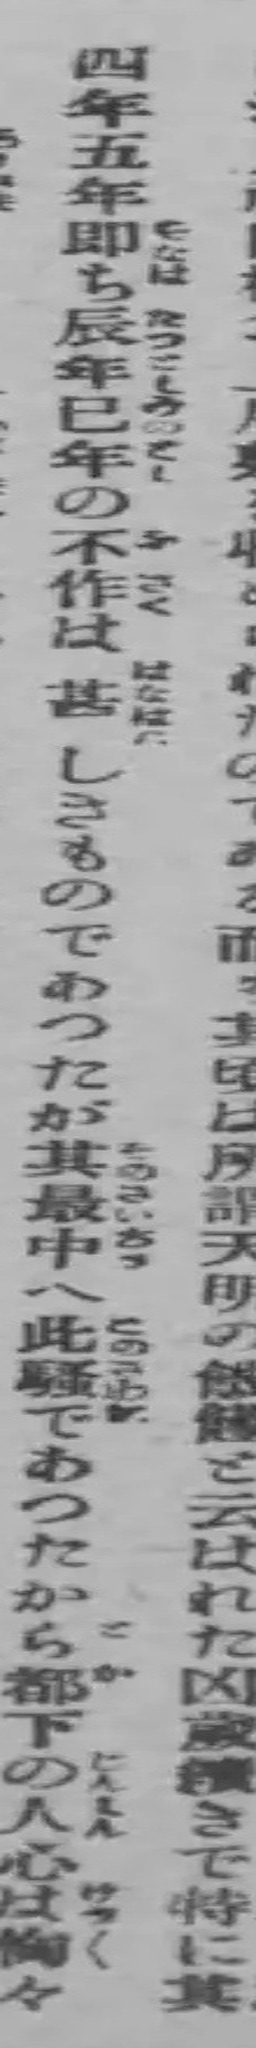四年五年即ち辰年巳年の不作は甚しきものであつたが其最中へ此騒であつたから都下の人心は恟々
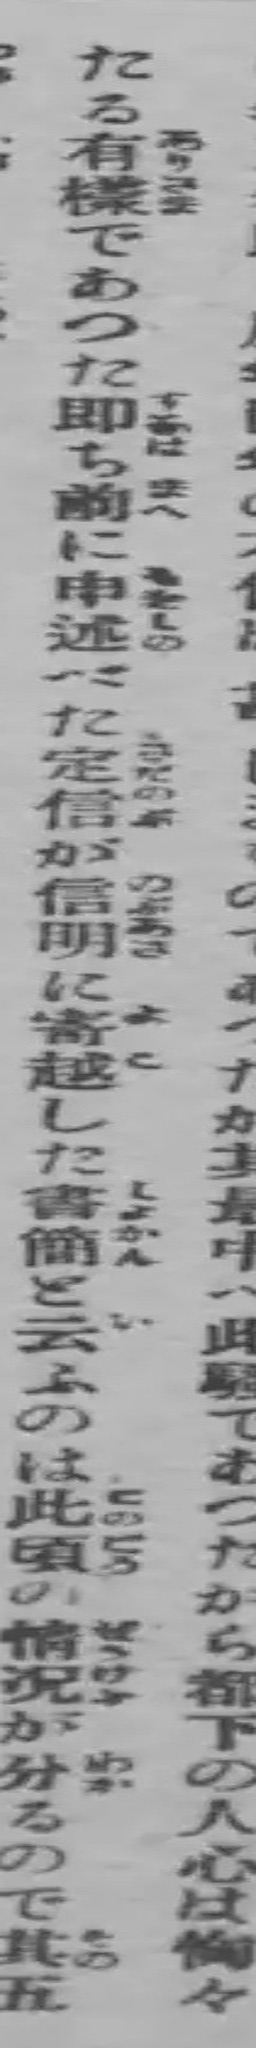たる有様であつた即ち前に申述べた定信が信明に寄越した書簡と云ふのは此頃の情況が分るので其五
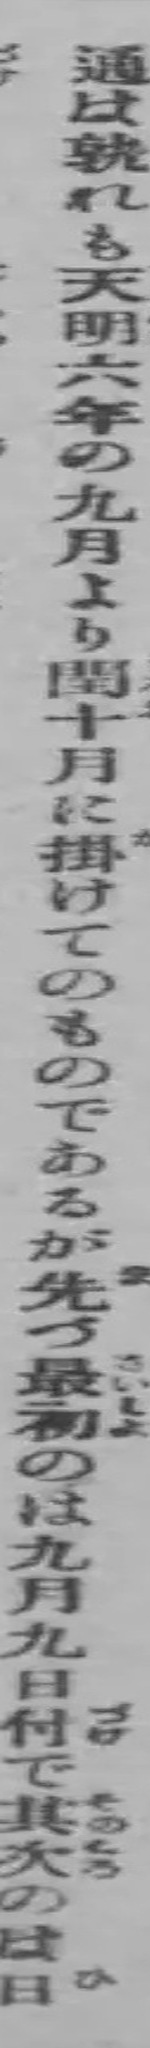通は孰れも天明六年の九月より閏十月に掛けてのものであるが先づ最初のは九月九日付で其次のは日
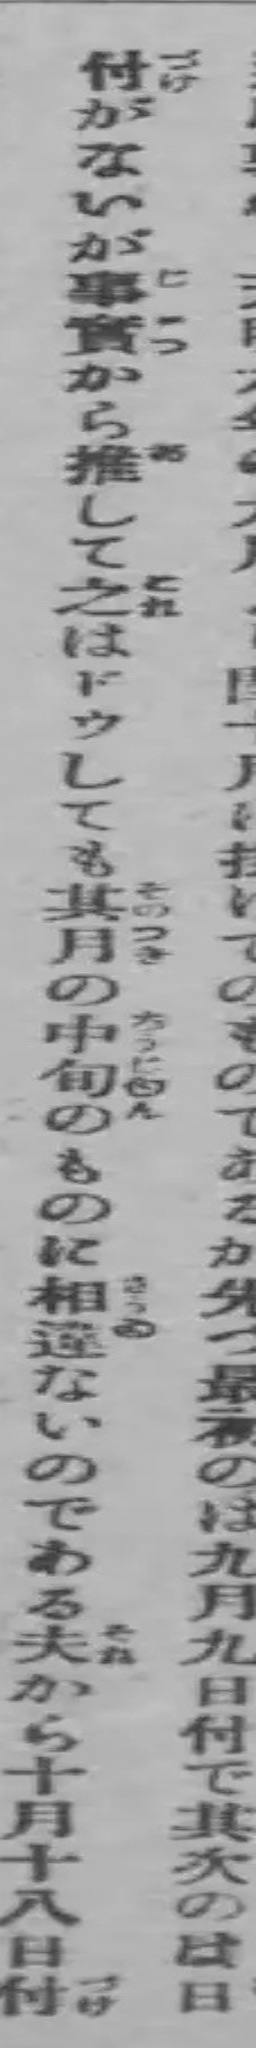付がないが事実から推して之はドウしても其月の中旬のものに相違ないのである夫から十月十八日付
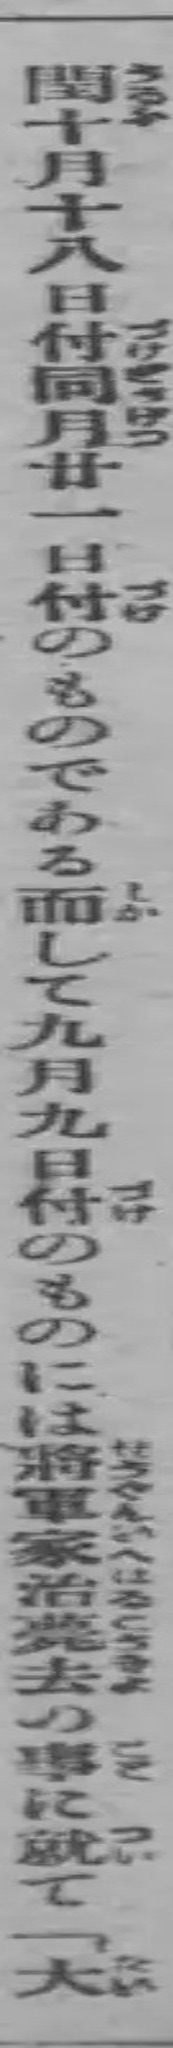閏十月十八日付同月廿一日付のものである而して九月九日付のものには将軍家治薨去の事に就て「大
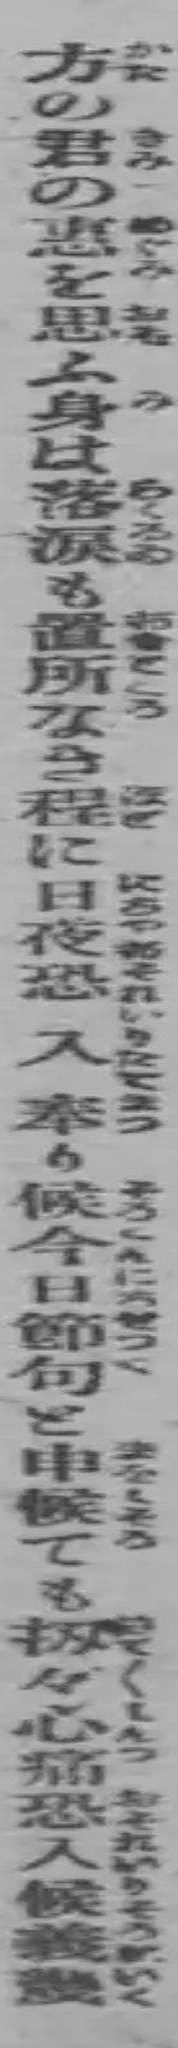方の君の恵を思ふ身は落涙も置所なき程に日夜恐入奉り候今日節句と申候ても扨々心痛恐入候義幾
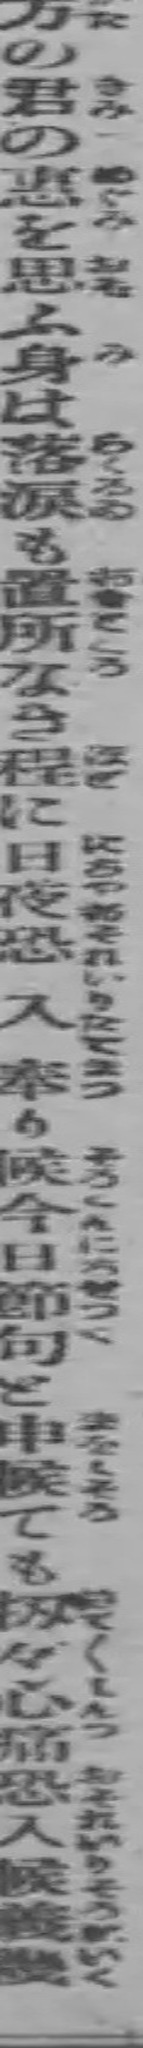方の君の恵を思ふ身は落涙も置所なき程に日夜恐入奉り候今日節句と申候ても扨々心痛恐入候義幾
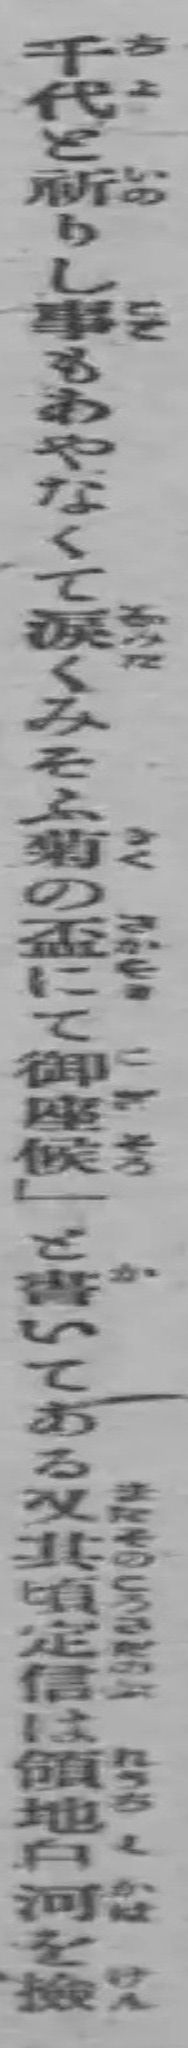千代と祈りし事もあやなくて涙くみそふ菊の盃にて御座候」と書いてある又其頃定信は領地白河を検
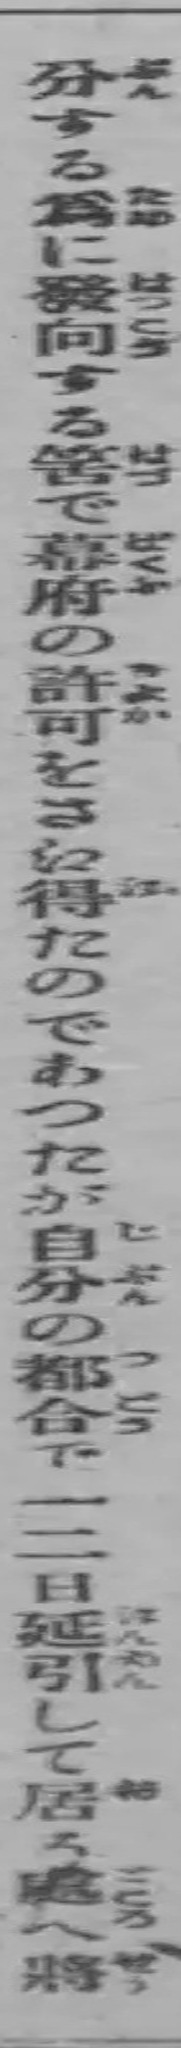分する為に発向する筈で幕府の許可をさえ得たのであつたが自分の都合で一二日延引して居る処へ将
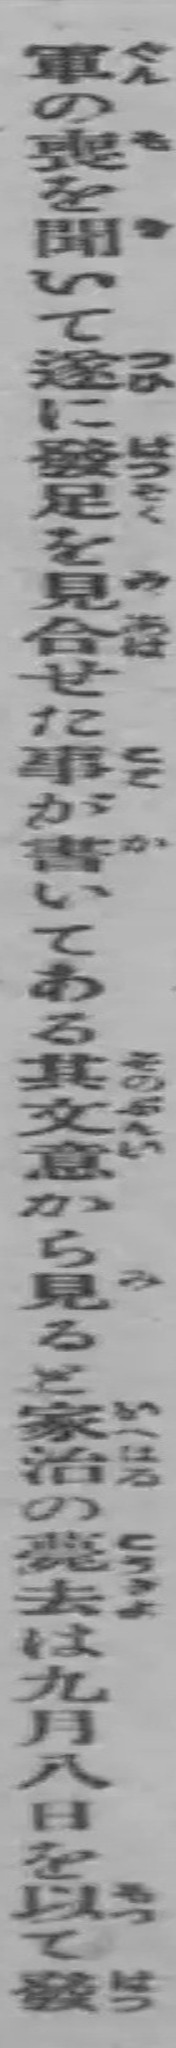軍の喪を聞いて遂に発足を見合せた事が書いてある其文意から見ると家治の薨去は九月八日を以て発
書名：豊橋市史談
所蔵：国立国会図書館 National Diet Library, JAPAN
